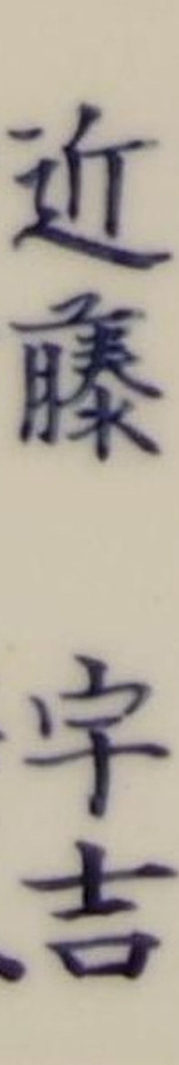近藤宇吉
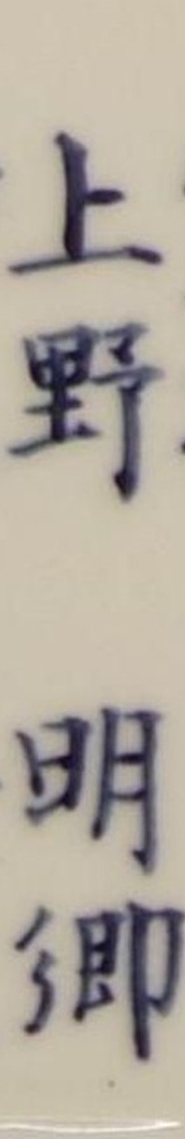上野明卿

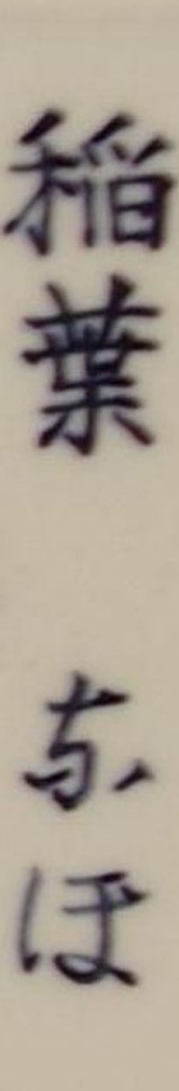稲葉なほ
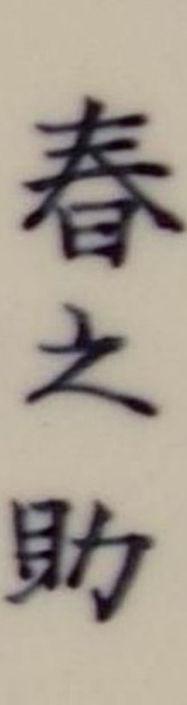春之助
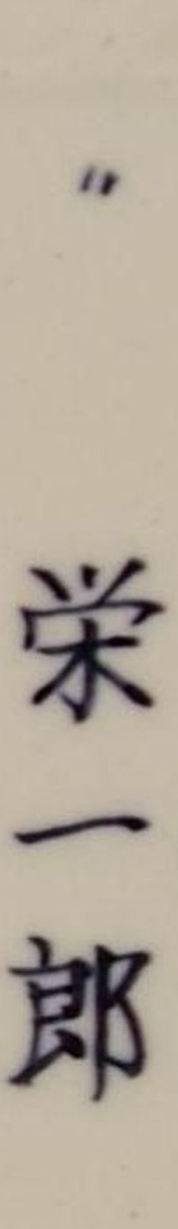栄一郎
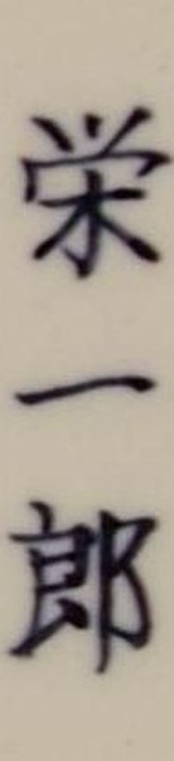栄一郎
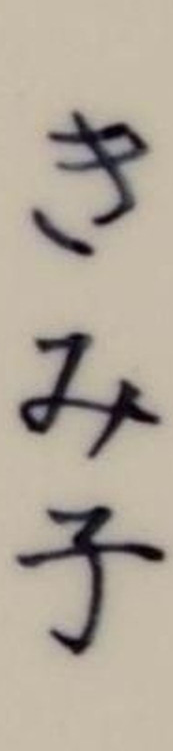きみ子
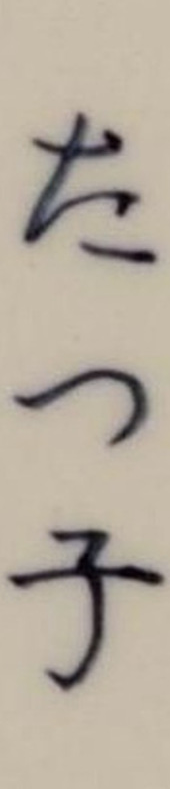たつ子
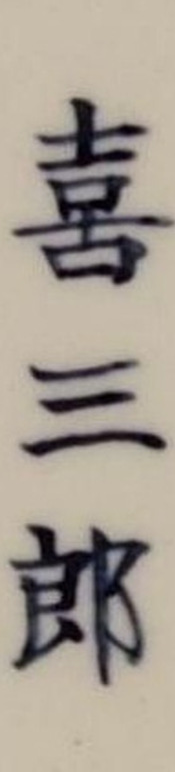喜三郎
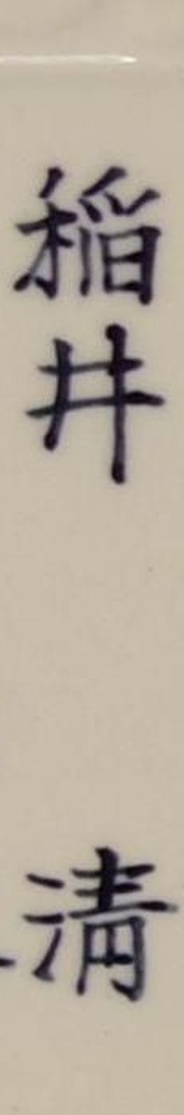稲井清
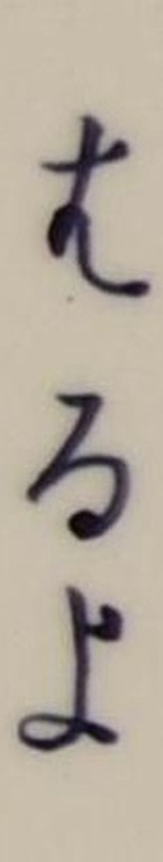はるよ

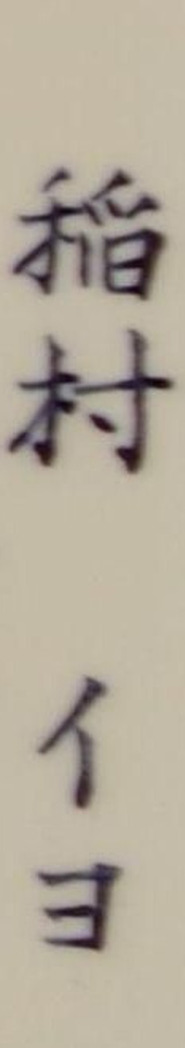稲村イヨ
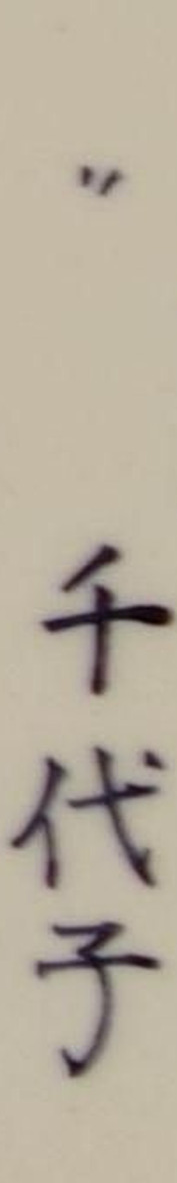千代子
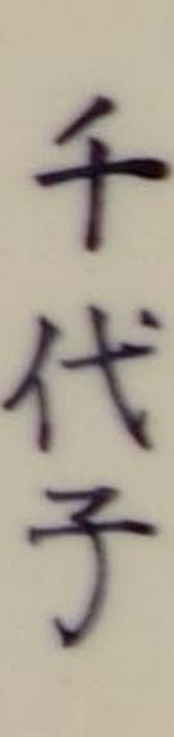千代子
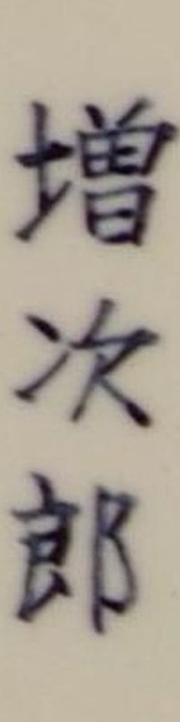増次郎
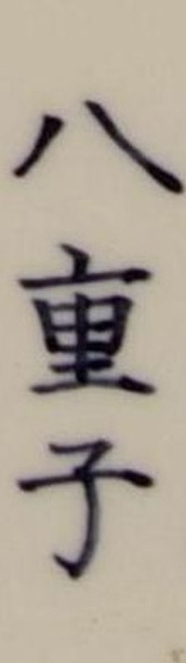八重子
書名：M~S
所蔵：高野山金剛峯寺
